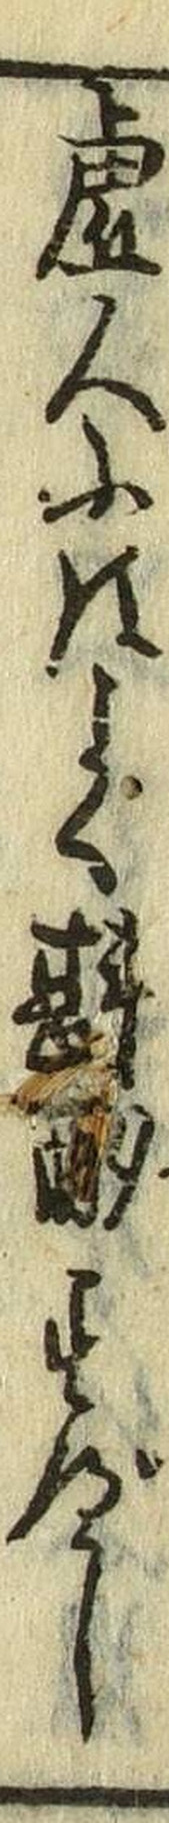虚人にはよく斟酌すべし
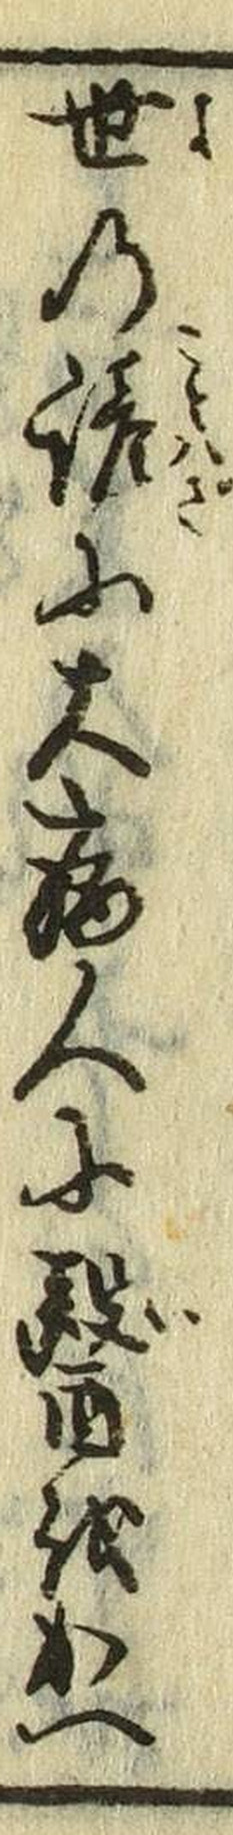世の諺に大病人に医をかへ
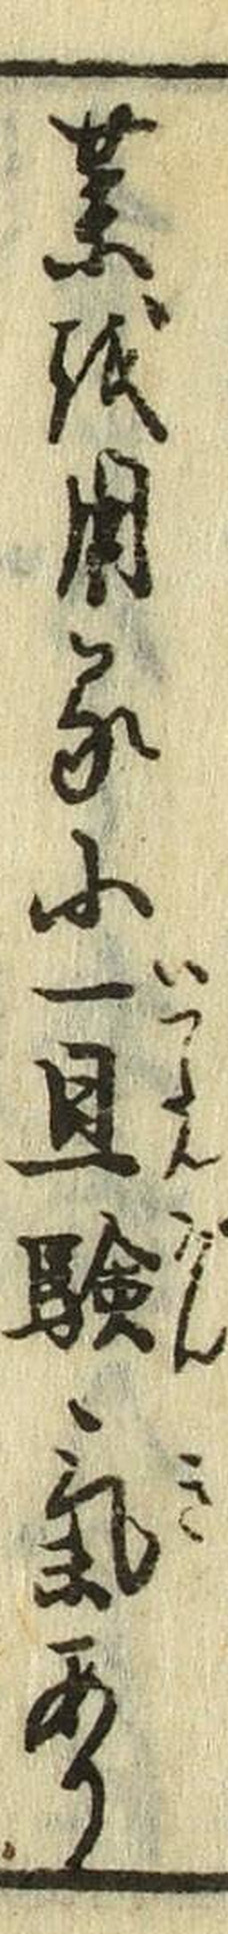薬を用るに一旦験気あり
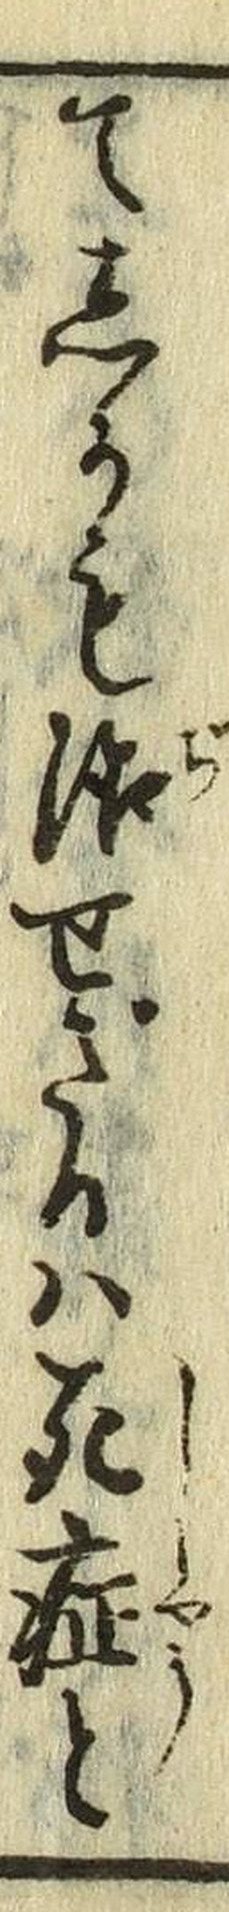てしかも治せざるは死症と
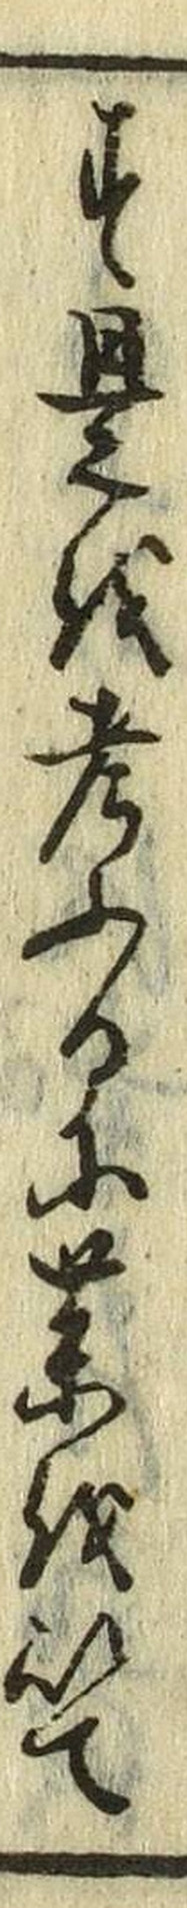す是を考ふるに薬を以て
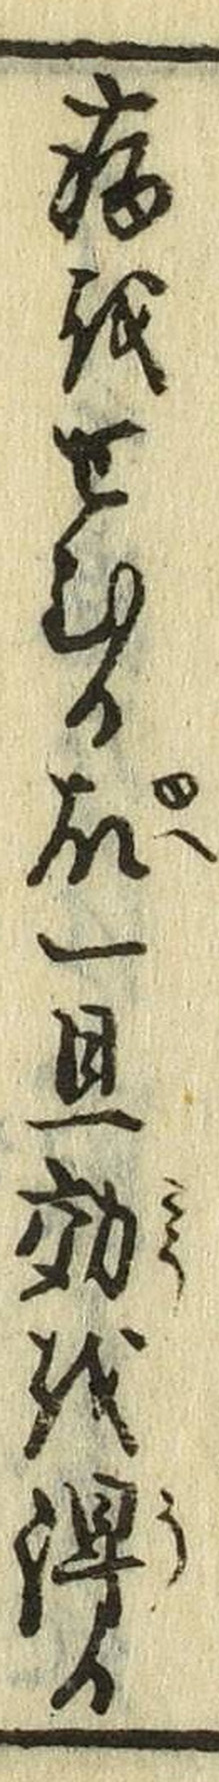病をせむる故一旦効を得る
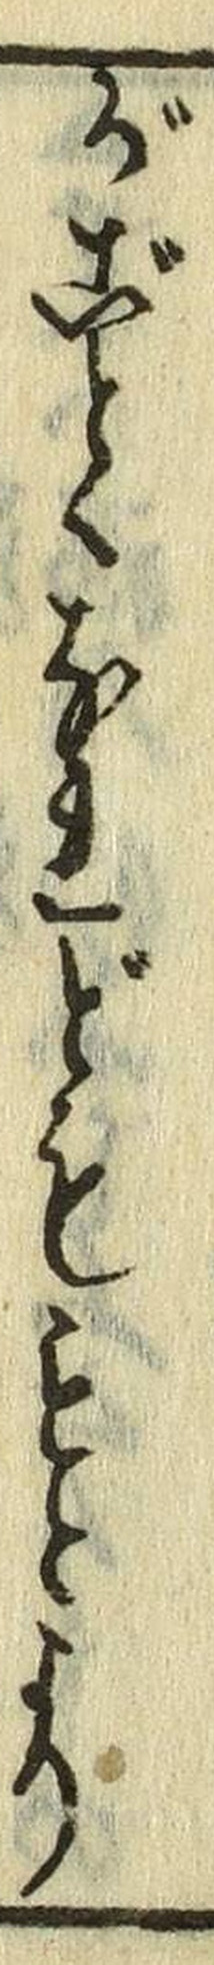がごとくなれどももとより
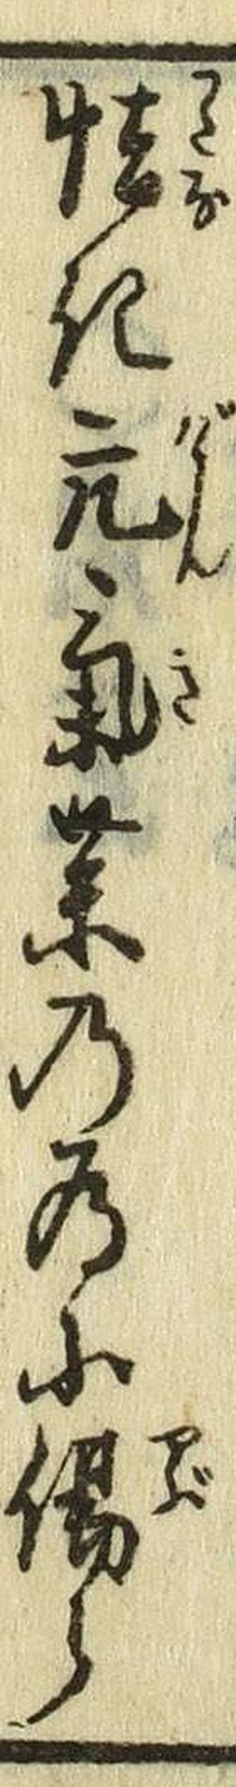拙き元気薬の為に傷ら
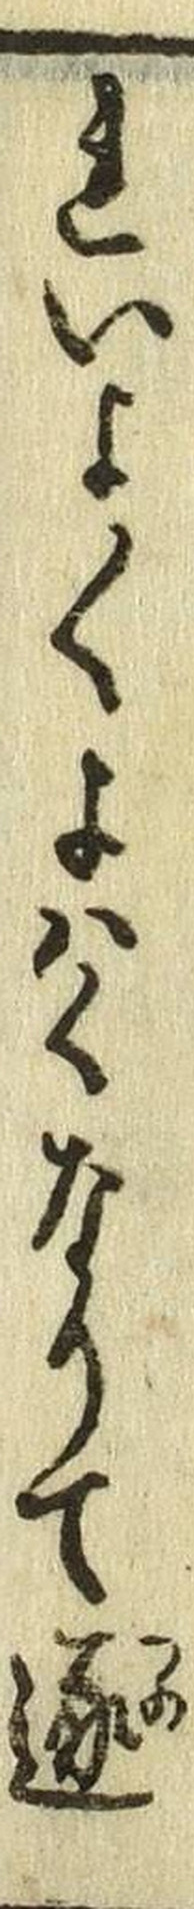れいよ〳〵よはくなりて遂
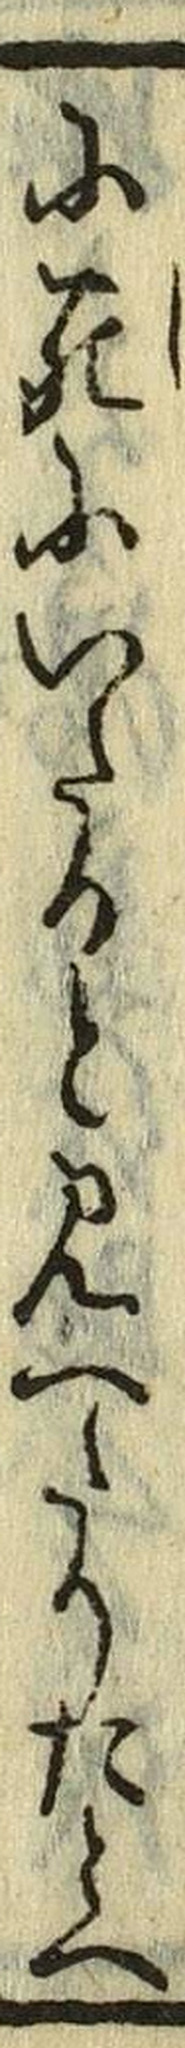に死にいたると見へたりたとへ
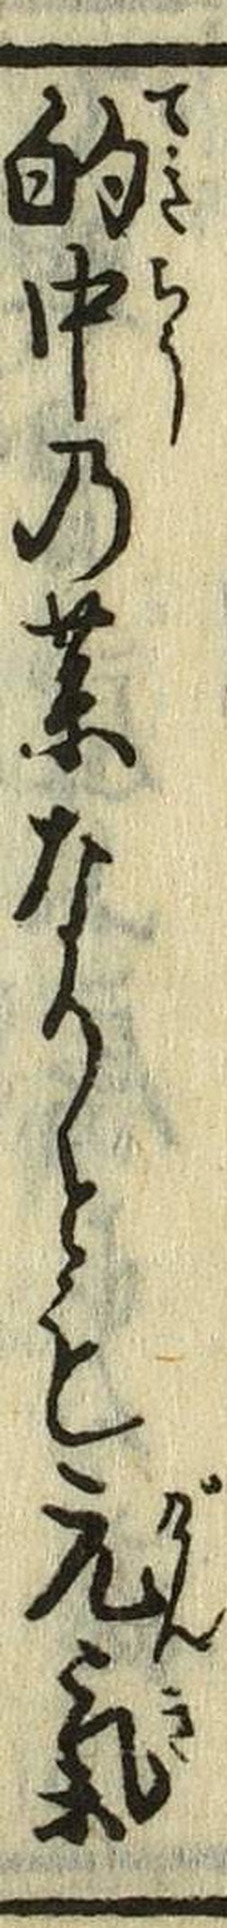的中の薬なりとも元気
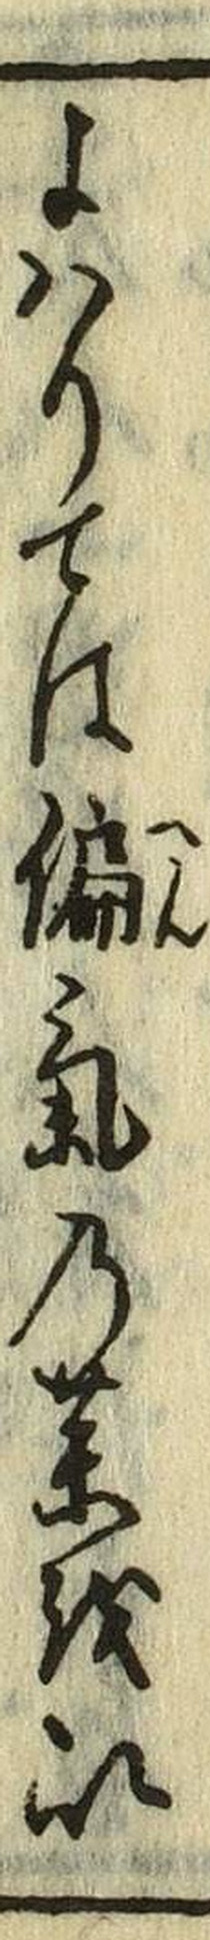よはりては偏気の薬を以
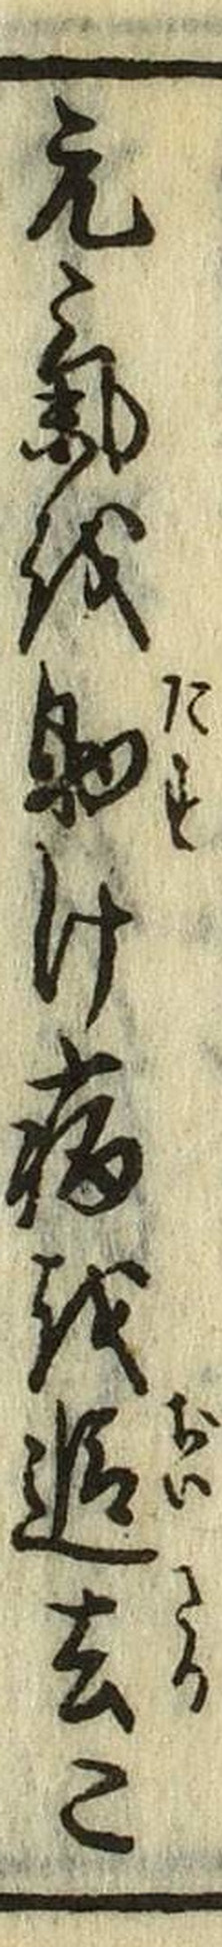元気を助け病を追去こ
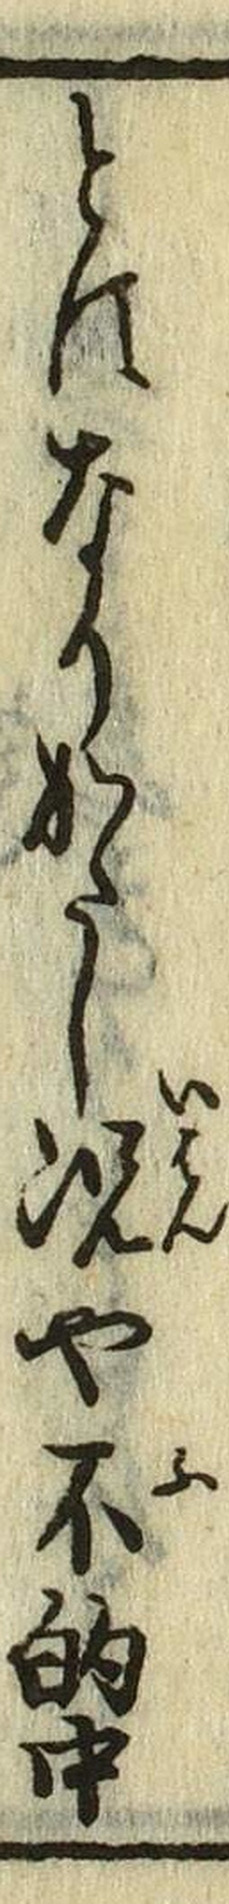とはなりかたし況や不的中
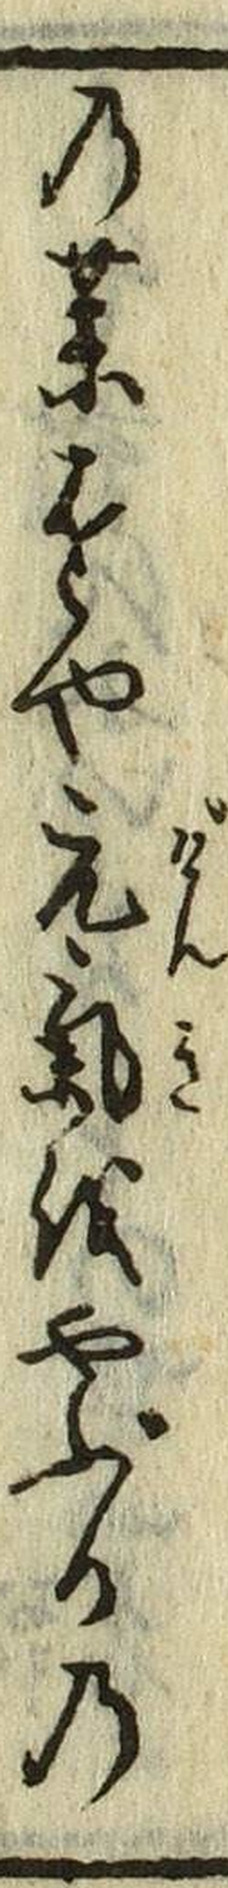の薬をや元気をやぶるの
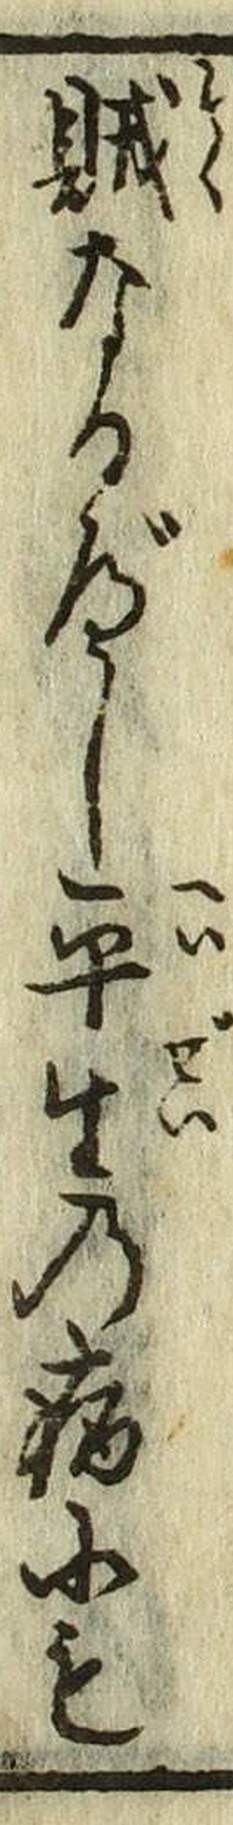賊なるべし平生の病にも
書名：居家養生記
